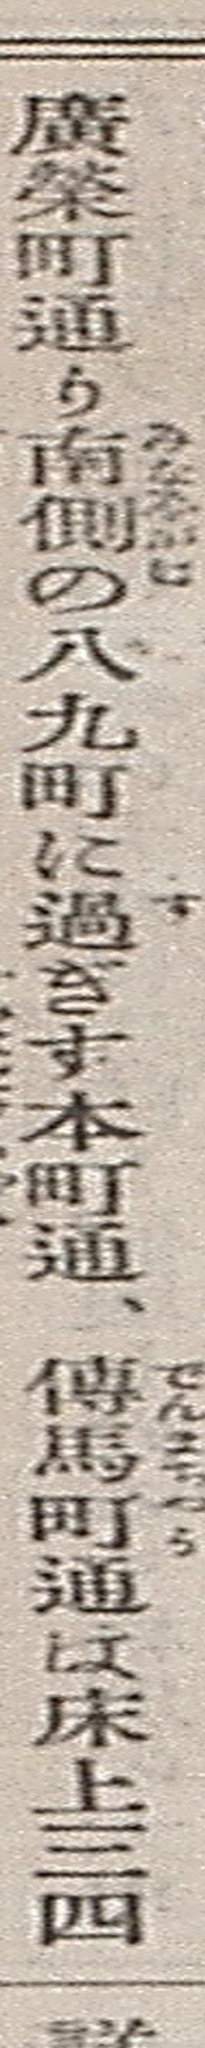広栄町通り南側の八九町に過ぎず本町通、伝馬町通は床上三四
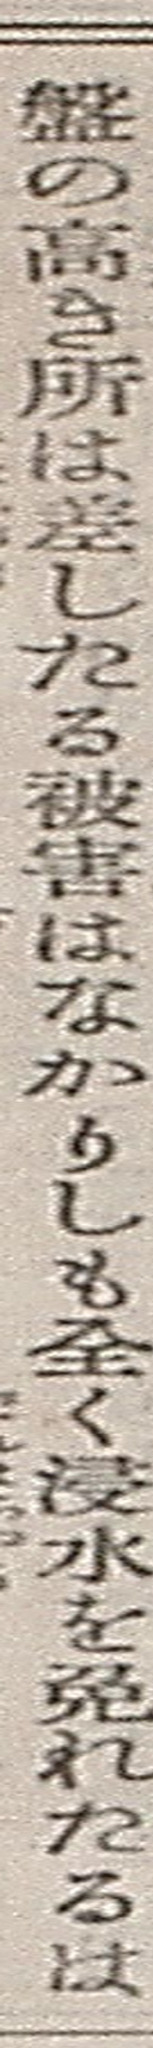盤の高き所は差たる被害はなかりしも全く浸水を免れたるは
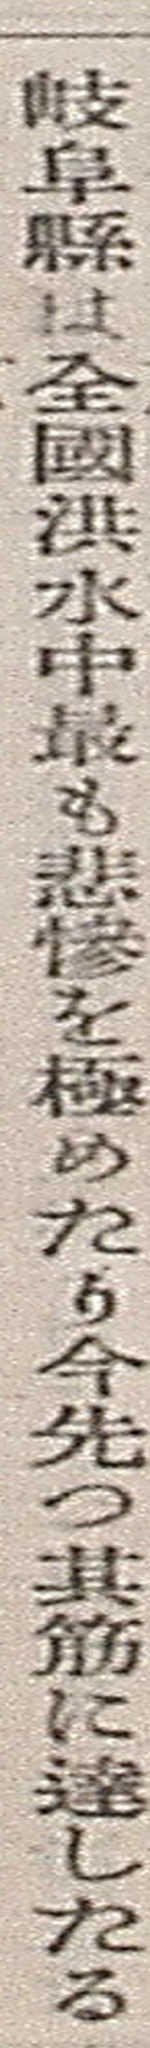岐阜県は全国洪水中最も悲惨を極めたり今先つ其筋に達したる
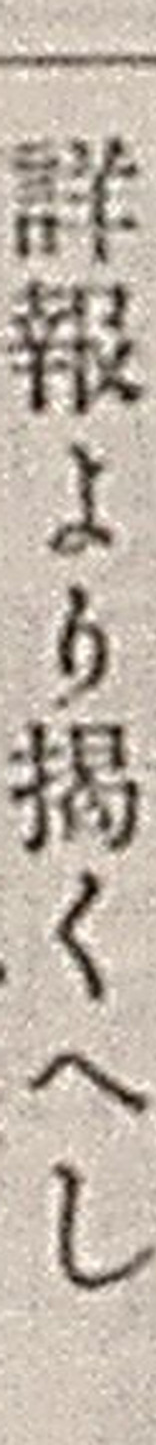詳報より掲くへし
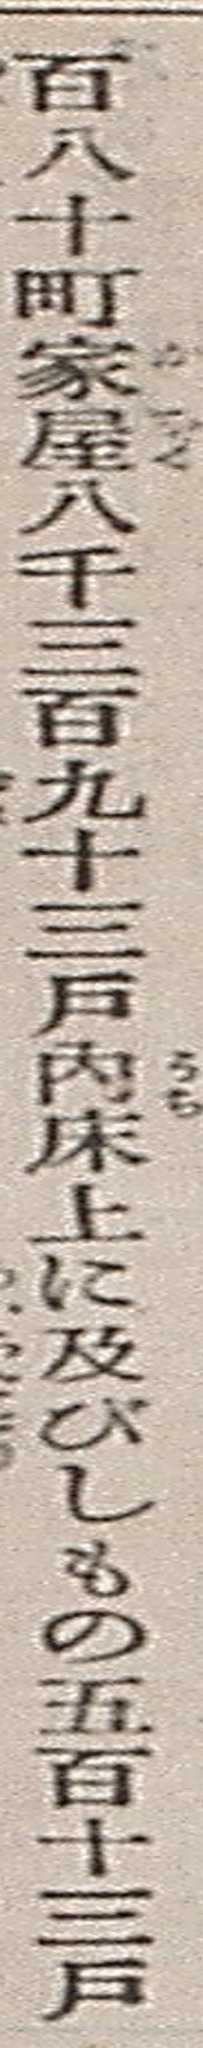百八十町家屋八千三百九十三戸内床上に及びしもの五百十三戸
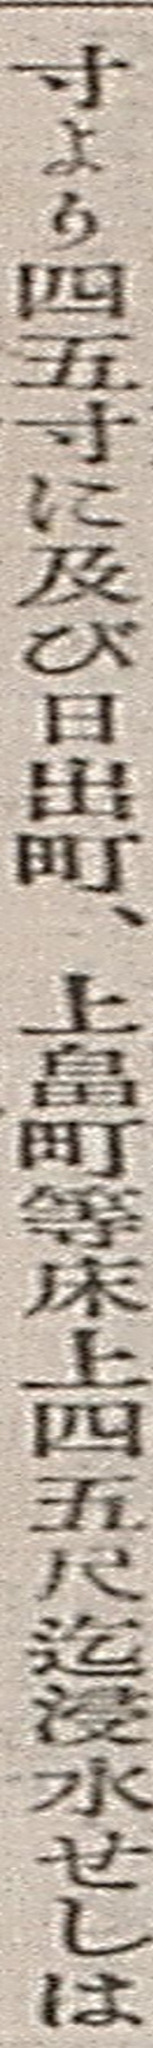寸より四五寸に及び日出町、上畠町等床上四五尺迄浸水せしは
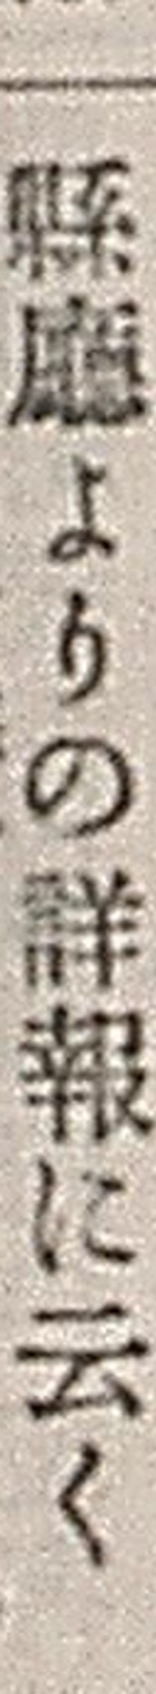県庁よりの詳報に言く
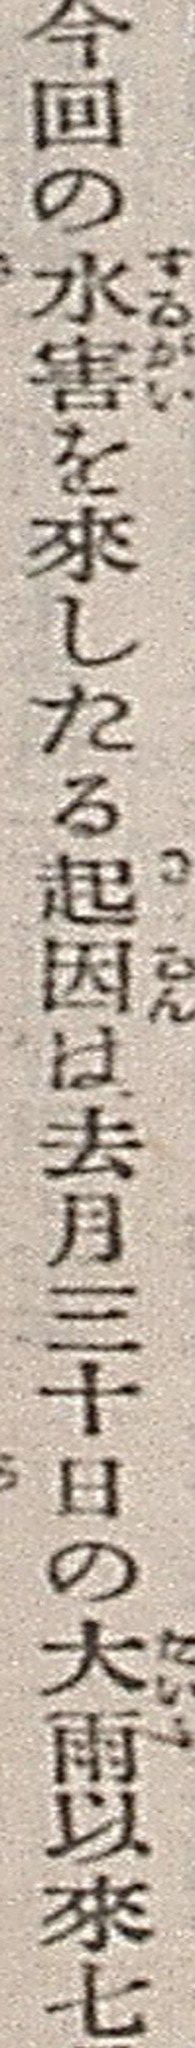今回の水害を来したる起因は去三十日の大雨以来七月に入り
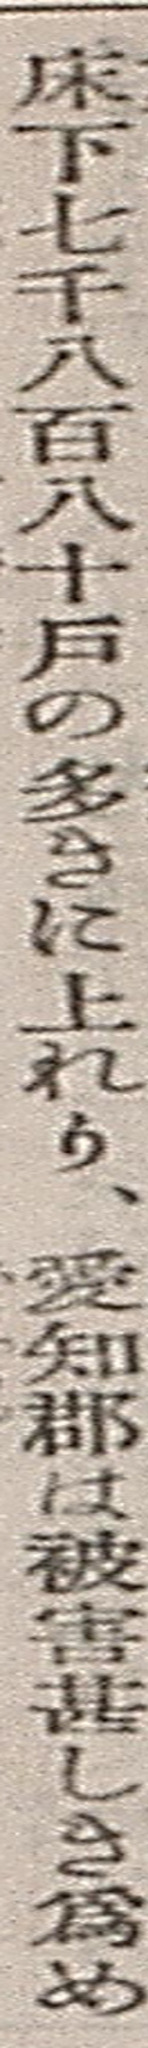床下七千八百八十戸の多きに上れり、愛知郡は被害甚しき為め
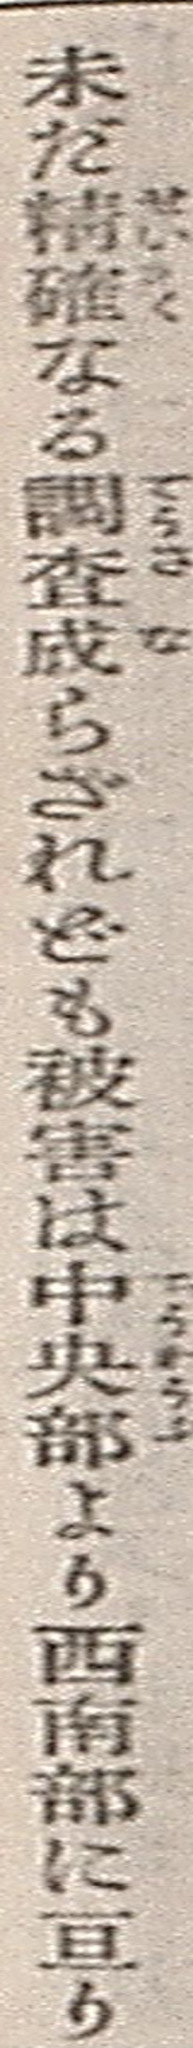未だ精確なる調査成らざれども被害は中央部より西南部に亘り
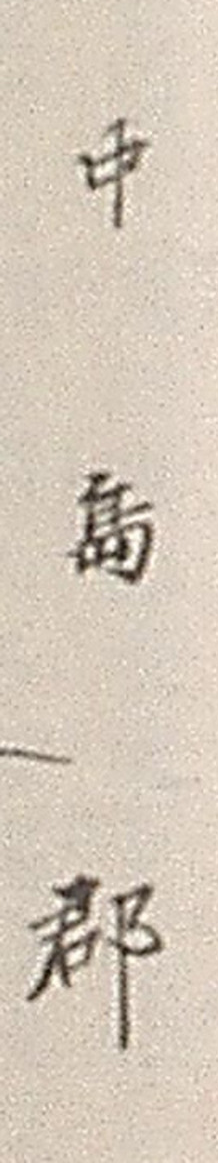中島郡
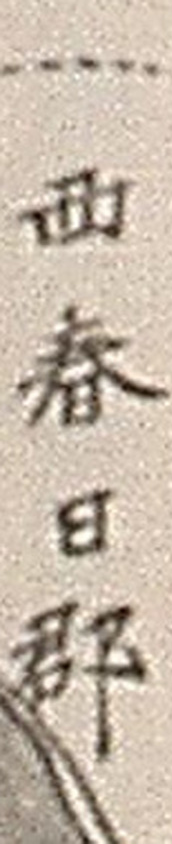西春日郡
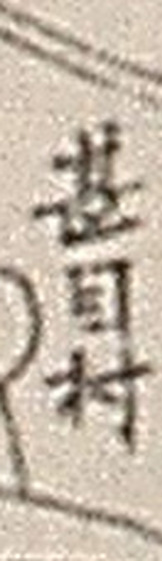甚目村
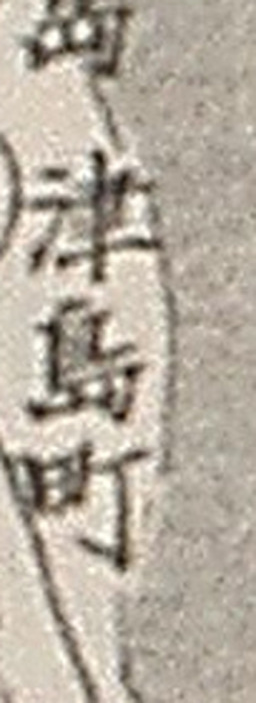津島町
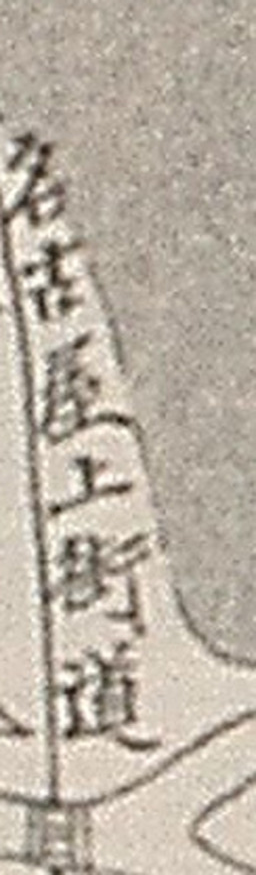名古屋上街道
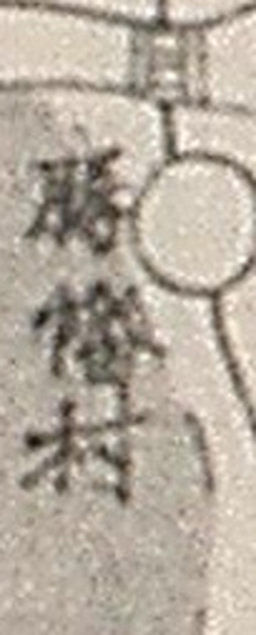勝幡村
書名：風俗畫報臨時増刊第百二十六號　洪水被害録（中）
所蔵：東京大学地震研究所図書室 Earthquake Research Institute Library, The University of Tokyo, JAPAN
